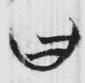曰
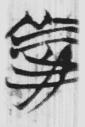義
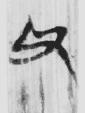父
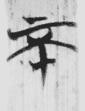不
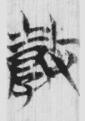{𣪊子}
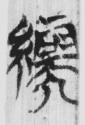繻
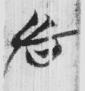左
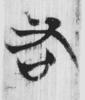右
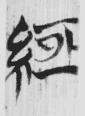絚
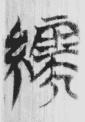繻
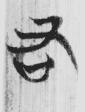右
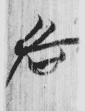左
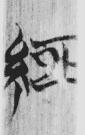絚
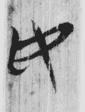女
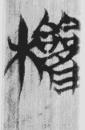權
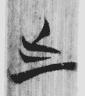之
